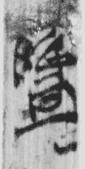{阜身土句}
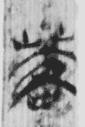{艸客}
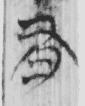有
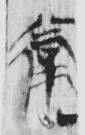常
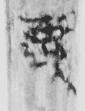卑
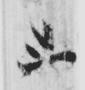之
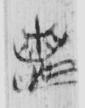若
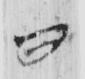日
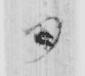月
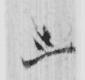之
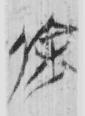俆
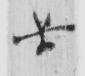弋
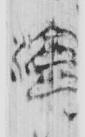淦
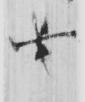弋
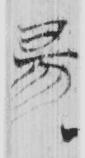昜
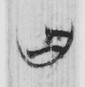曰
